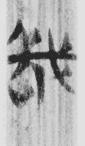{苟戈}
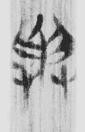與
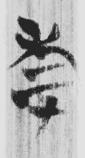考
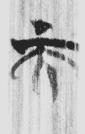而
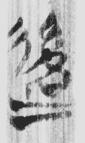{後口}
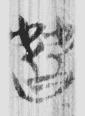朁
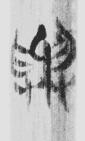與
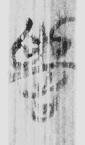{言爲}
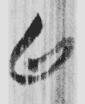㠯（以）
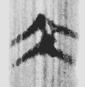大
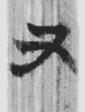又
